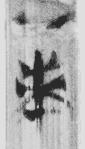未
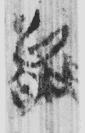能
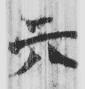亓
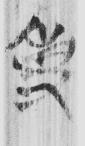事
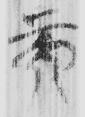而
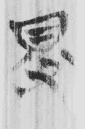𠭁
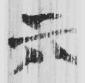亓
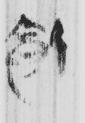飤
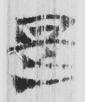是
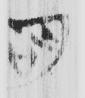名
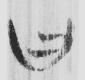曰
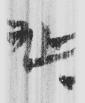喪
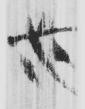必
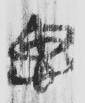思
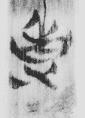事
